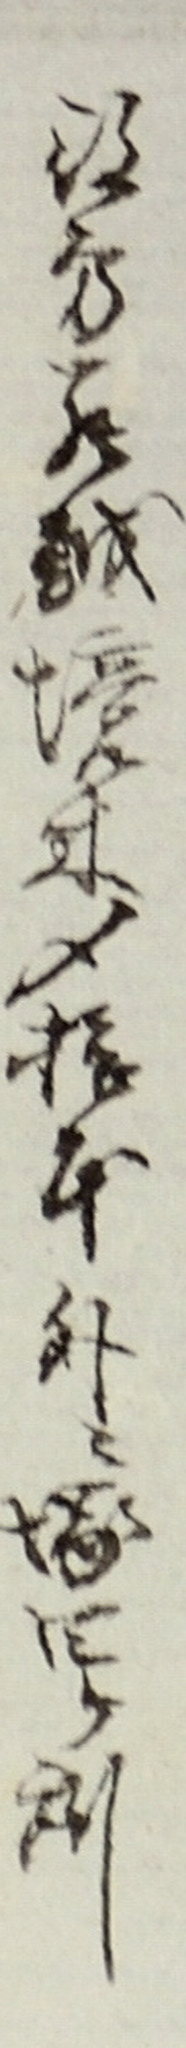役方罷越境木〆拾本外ニ塚四ケ所
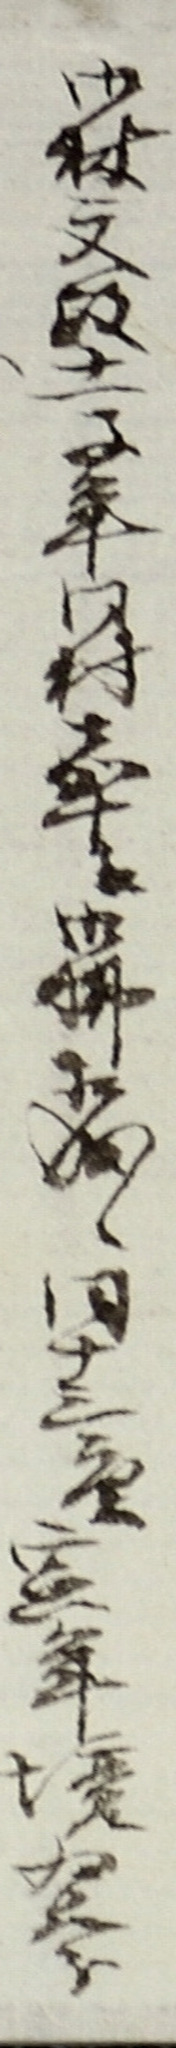御林文政十一子年同村嘉十え御払相成候同十三庚寅年境為見分

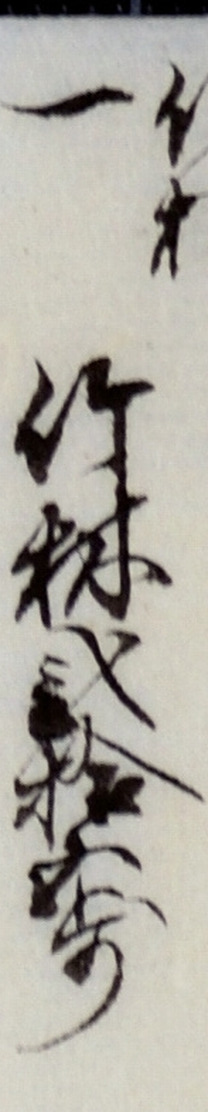一竹林弐拾五歩
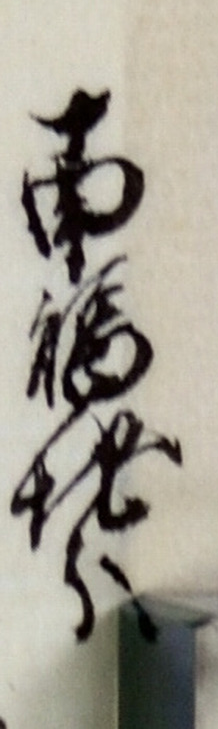南福地分
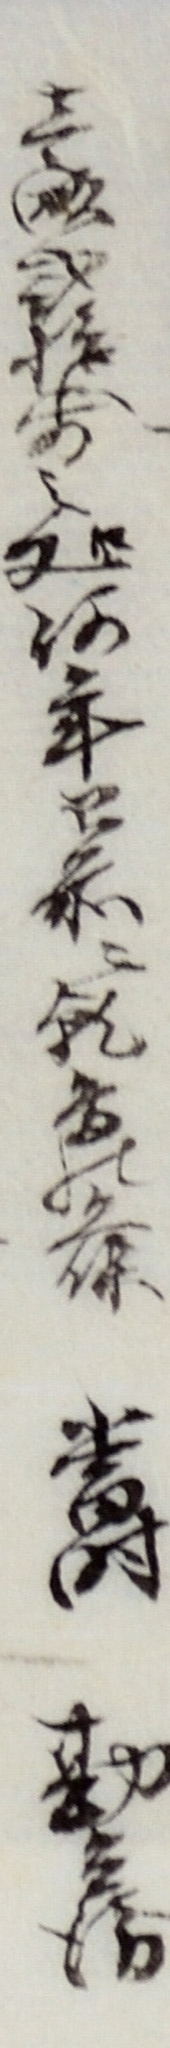壱畝弐拾歩之処何年已前に欤鳥の久保当時勘兵衛
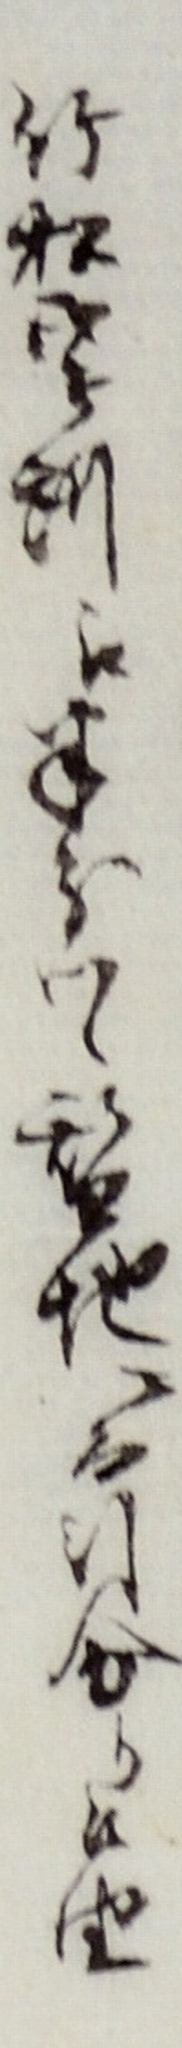竹松弐ケ所え半分ツヽ替地に而引分ケ候由
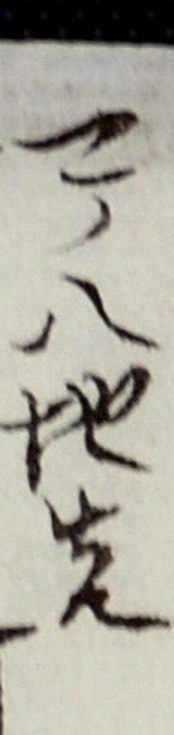マノ八地先
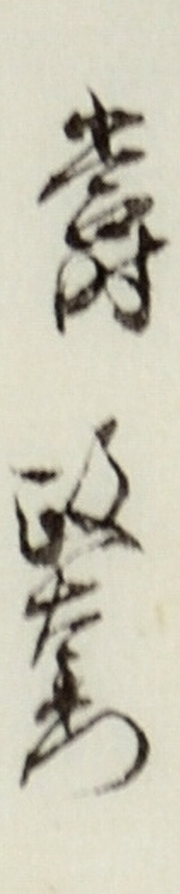当時政右衛門
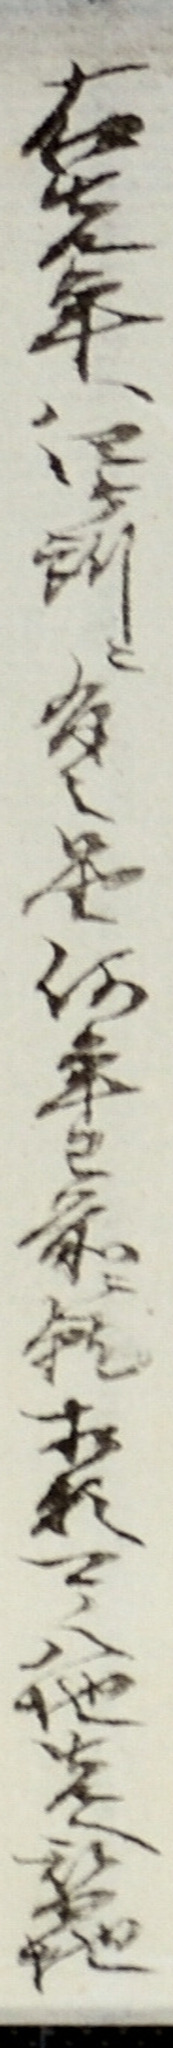右先年ハ四ケ所ニ有之候由何年已前ニ欤相願マノ八地先へ替地
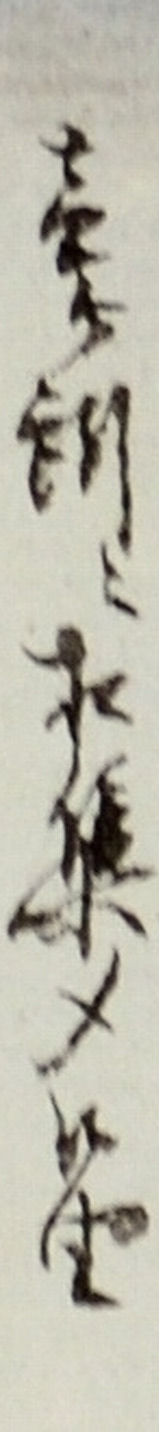壱ケ所ニ相集メ候由
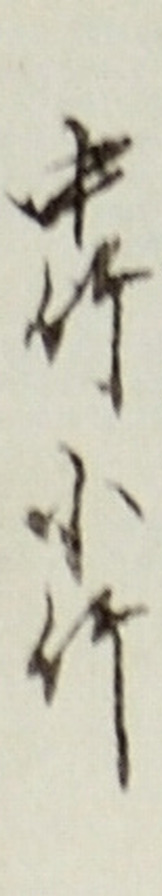中竹小竹

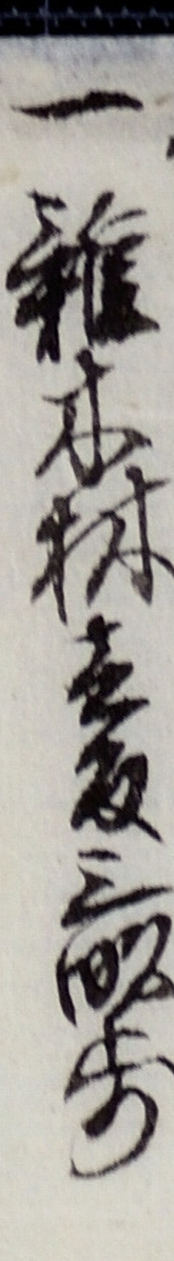一雑木林壱反三畝
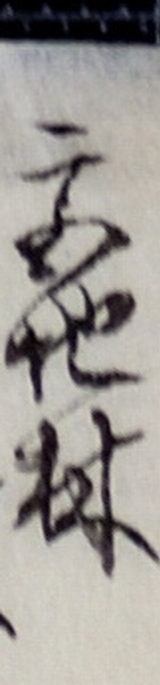宮地林
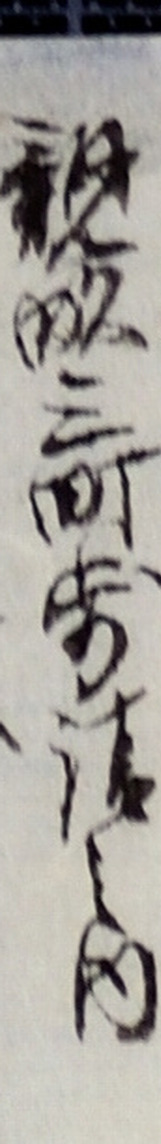親畝三町歩請之内
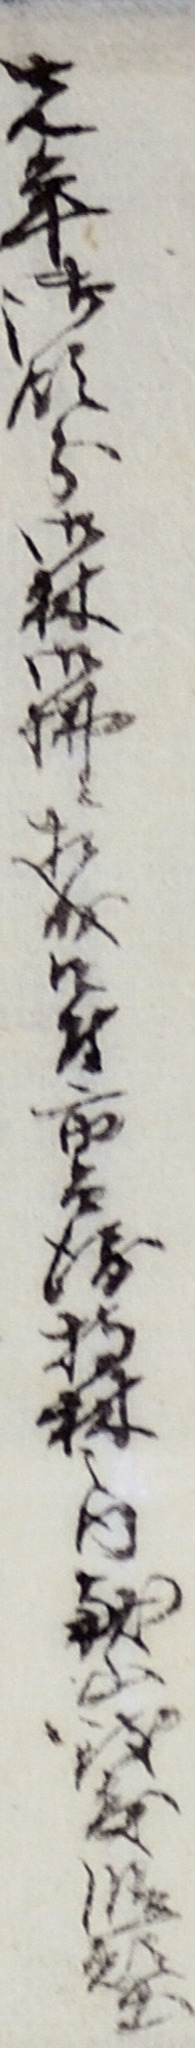先年御領分御林御払ニ相成候付市兵衛持林之内献山致度段願出
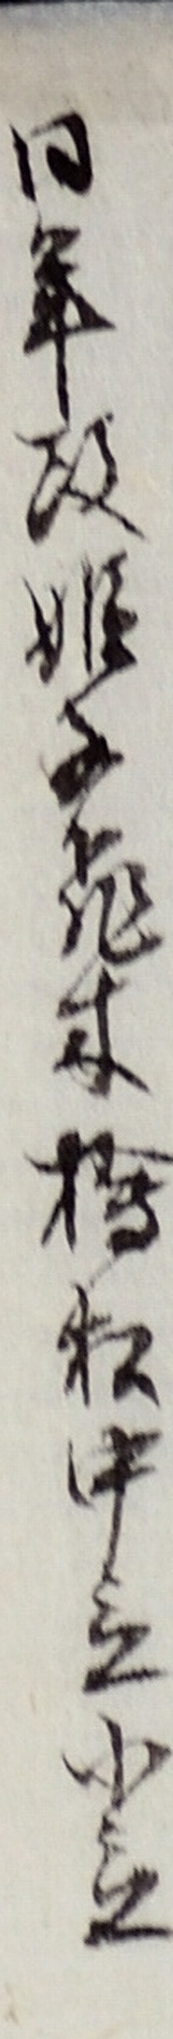同年改姫子飛木桧松中立小立
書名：山林帳草稿
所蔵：伊那市立高遠町図書館・合同会社AMANE
